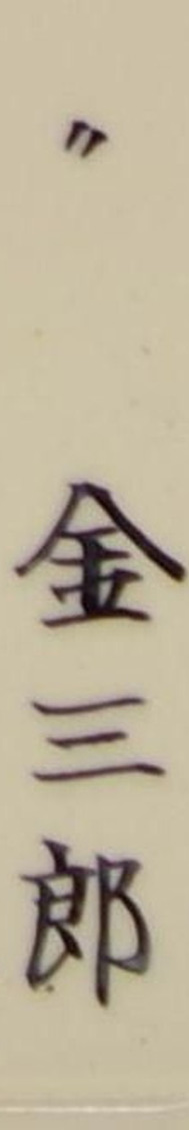金三郎
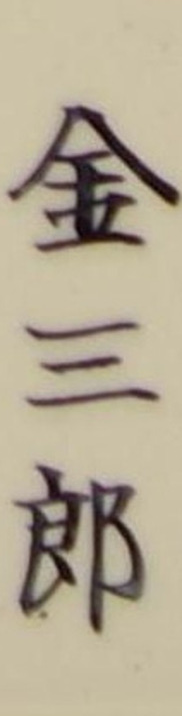金三郎
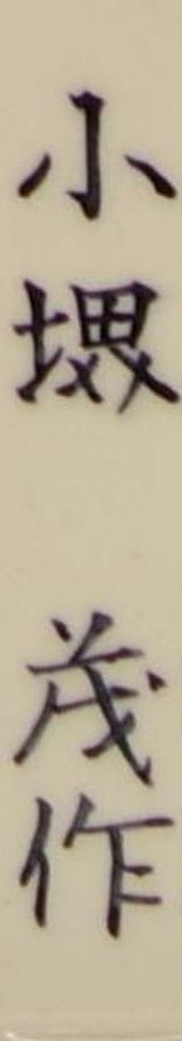小堺茂作
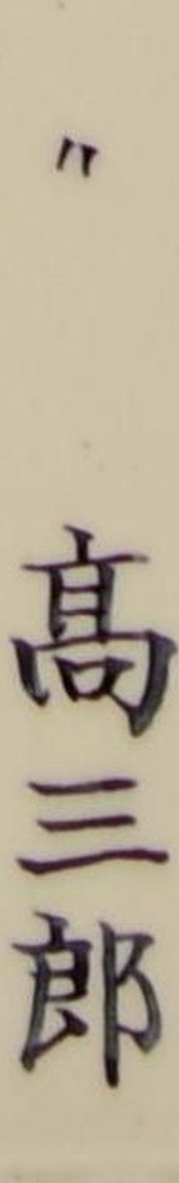高三郎
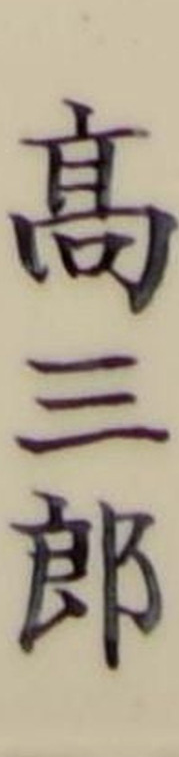高三郎
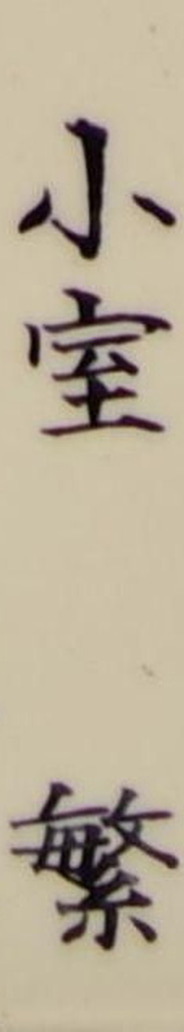小室繁
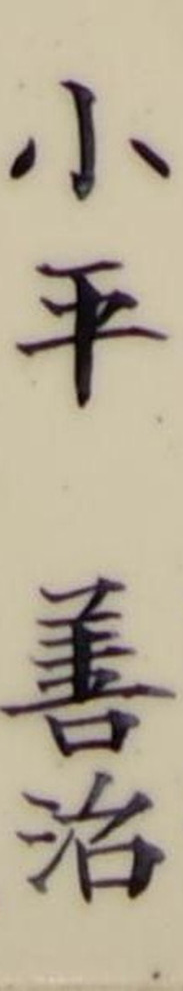小平善治
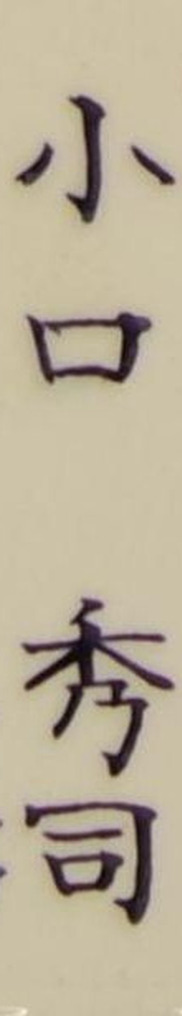小口秀司

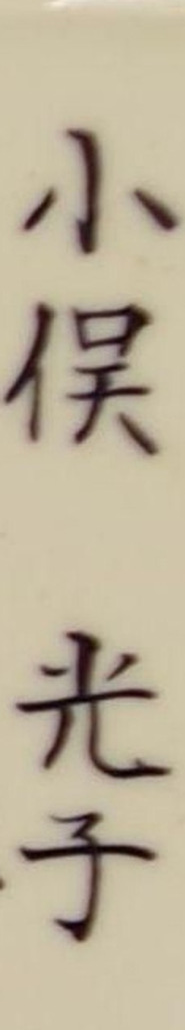小俣光子
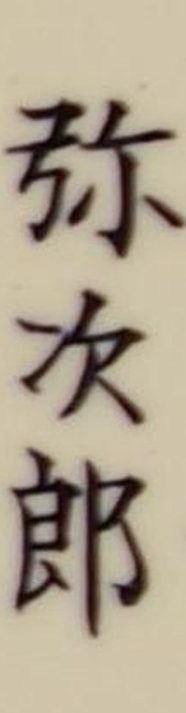弥次郎
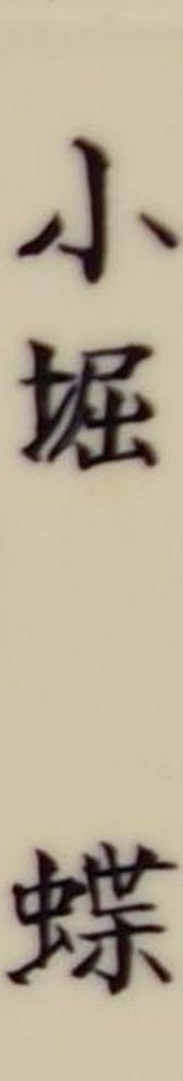小堀蝶
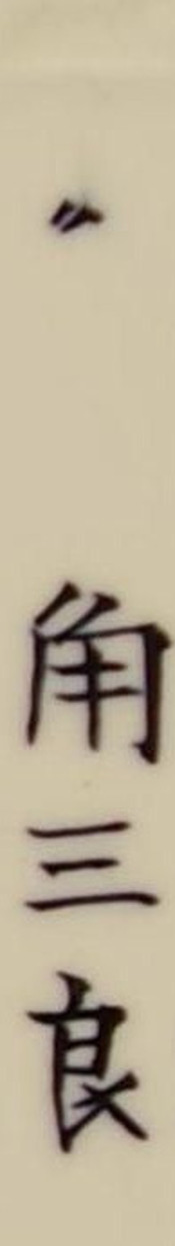角三良
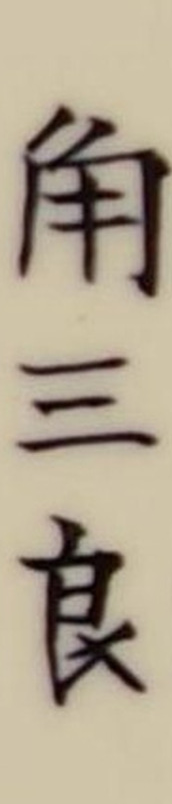角三良
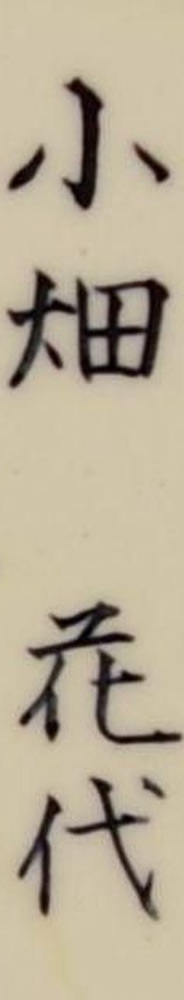小畑花代
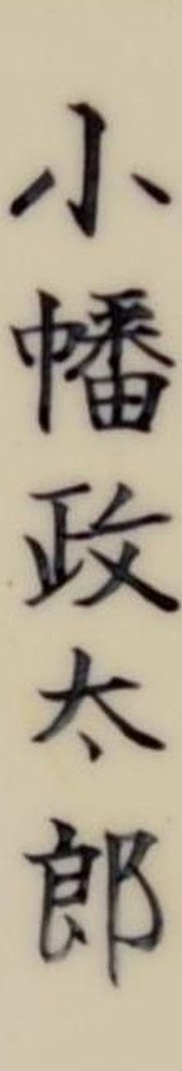小幡政太郎
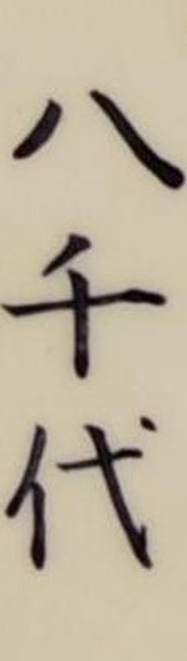八千代
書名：E~L
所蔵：高野山金剛峯寺
